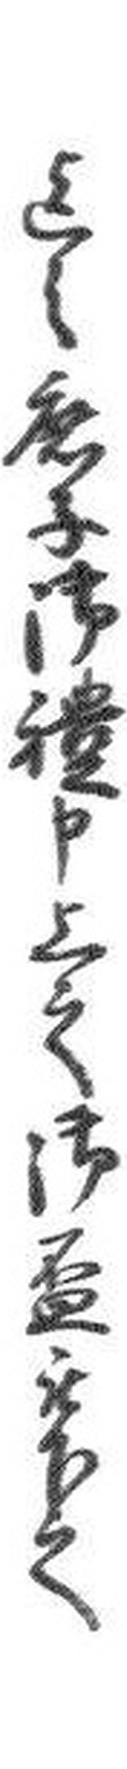迄之庶子御礼申上之御盃被下之
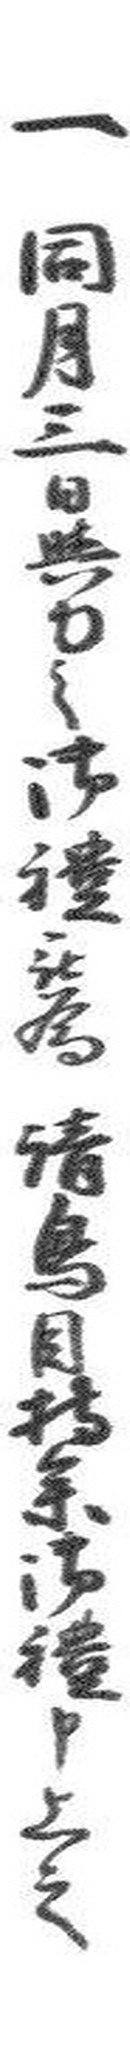一同月三日与力之御礼被為請鳥目持参御礼申上之
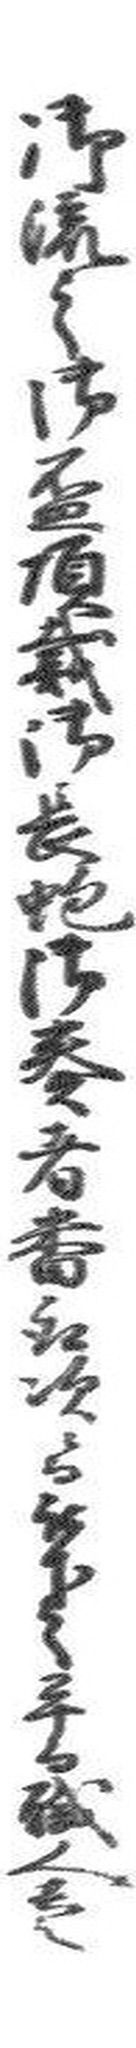御流之御盃頂戴御長蚫御奏者番取次ニ而被下之畢而職人等之
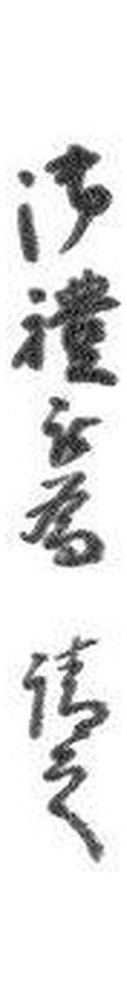御礼被為請之
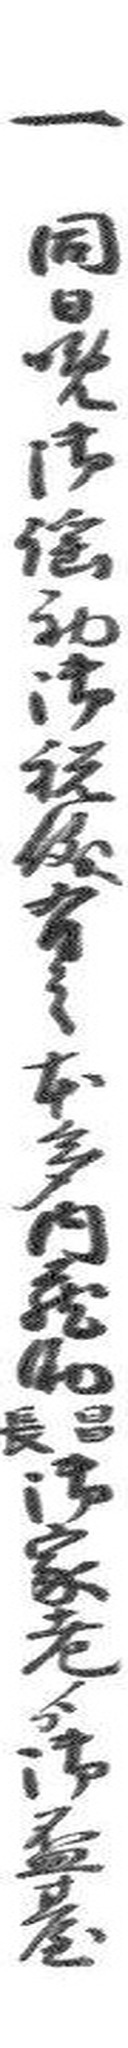一同日晩御謡初御祝儀有之本多内蔵助昌長御家老ゟ御盃台
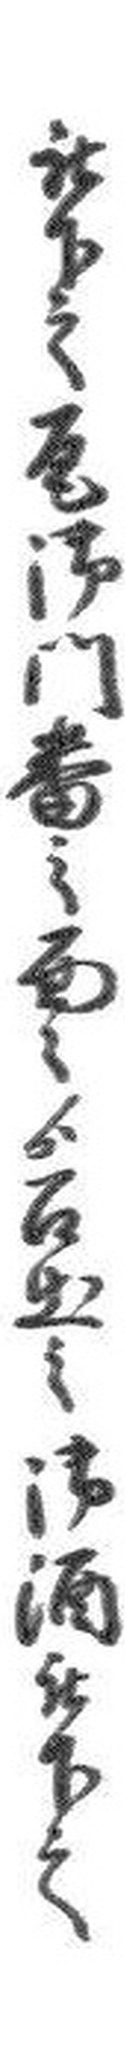被下之瓦御門番之面々ゟ召出之御酒被下之
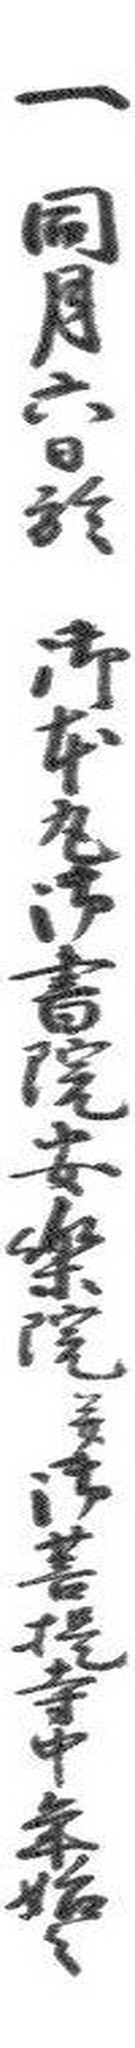一同月六日於御本丸御書院安楽院并御菩提寺中年始之
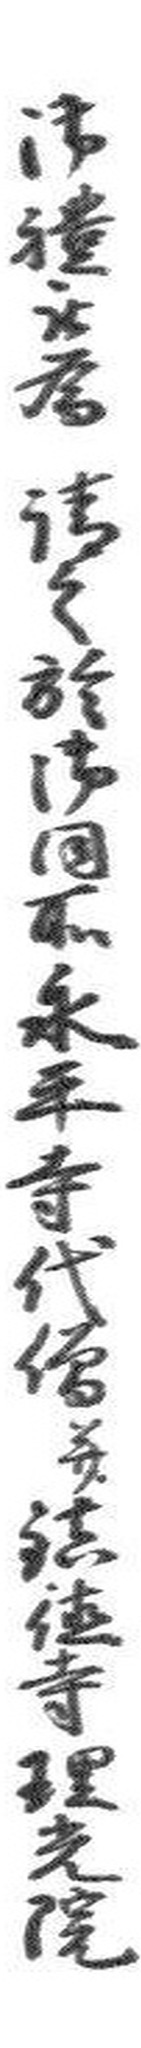御礼被為請之於御同所永平寺代僧并鎮徳寺理光院

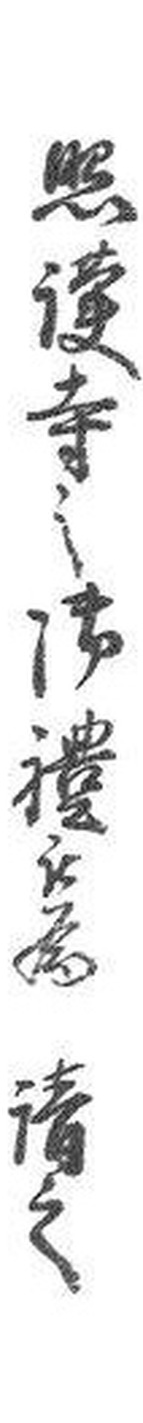照護寺之御礼被為請之
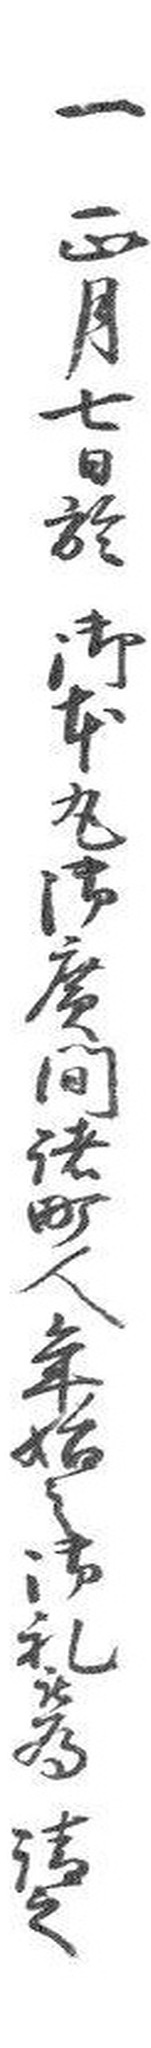一正月七日於御本丸御広間諸町人年始之御礼被為請之
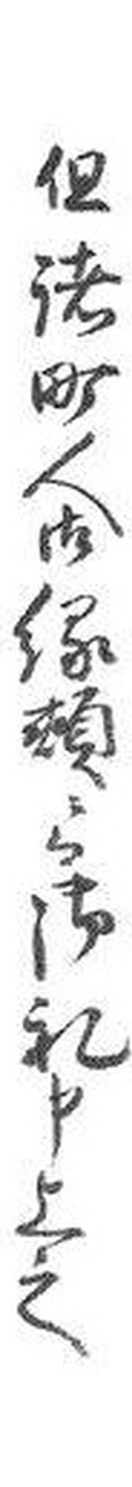但諸町人御縁頬ニ而御礼申上之
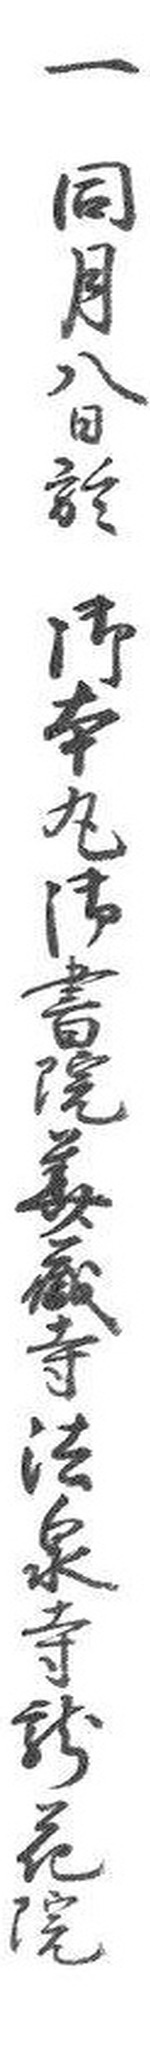一同月八日於御本丸御書院華蔵寺法泉寺龍花院
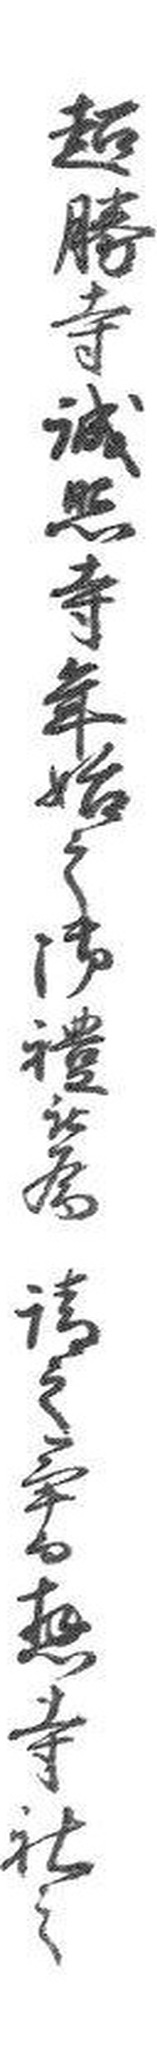超勝寺誠照寺年始之御礼被為請之畢而惣寺社之
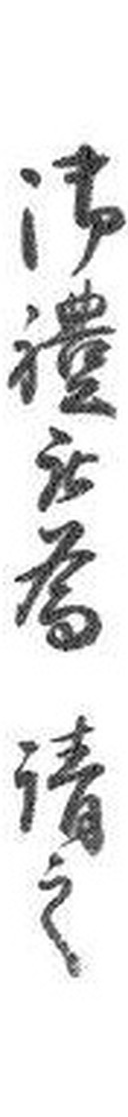御礼被為請之
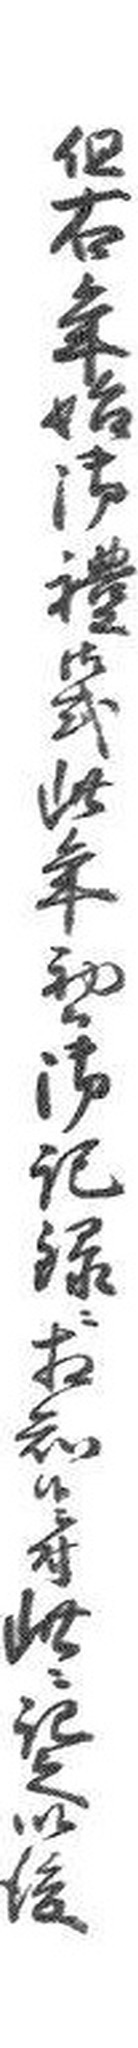但右年始御礼御式此年初而御記録ニ相知候ニ付此ニ記之以後
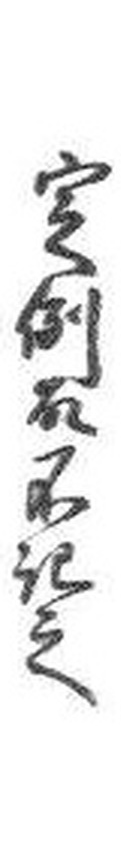定例故不記之
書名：家譜 六 光通公 従万治三年到寛文三年
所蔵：福井県文書館 Fukui Prefectural Archives
